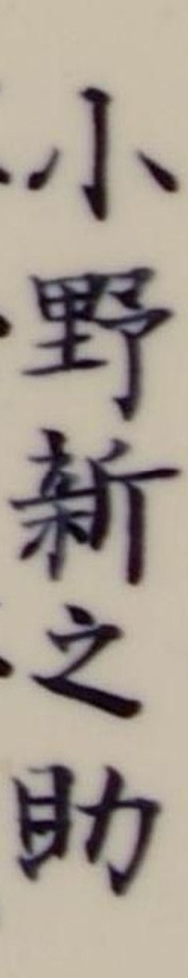小野新之助
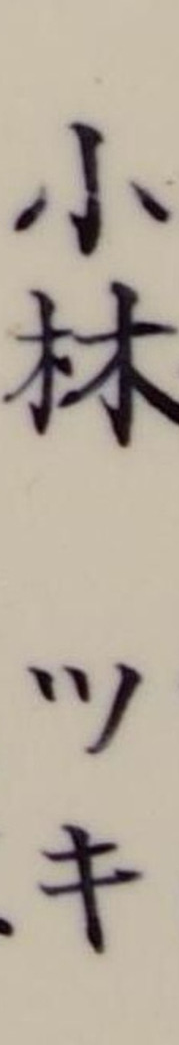小林ツキ
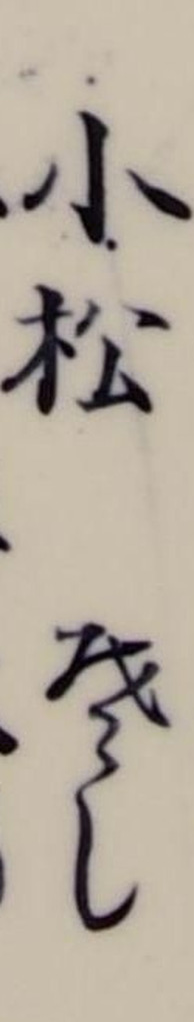小松そし
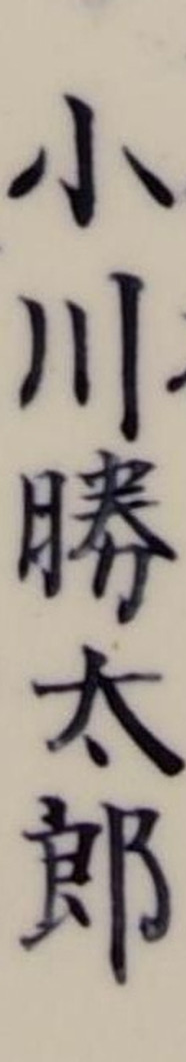小川勝太郎
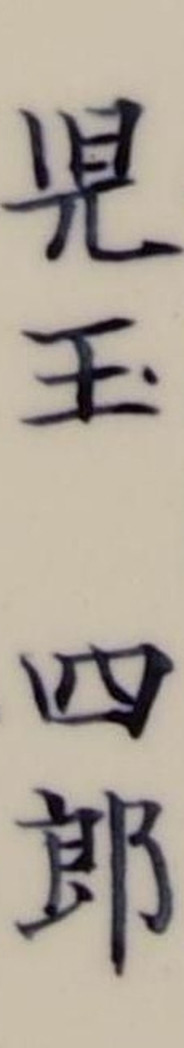児玉四郎
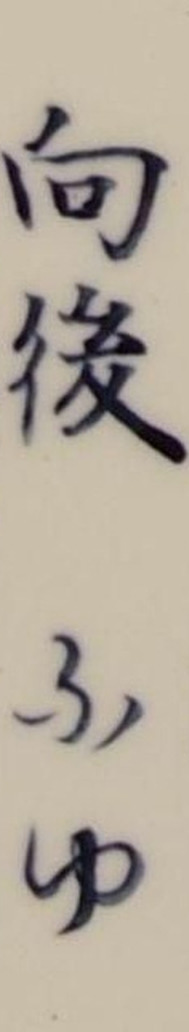向後ふゆ
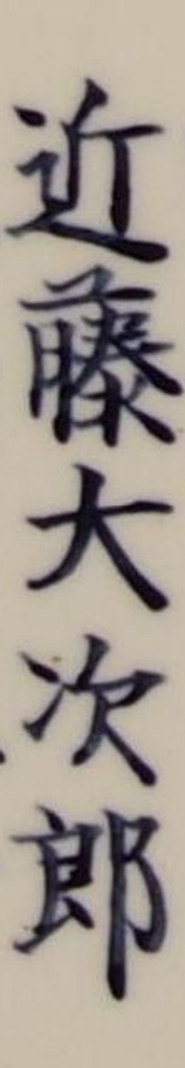近藤大次郎
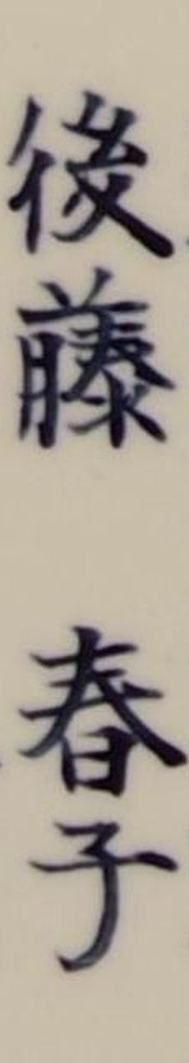後藤春子
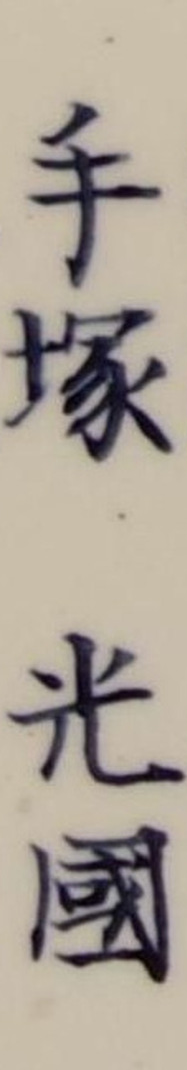手塚光國
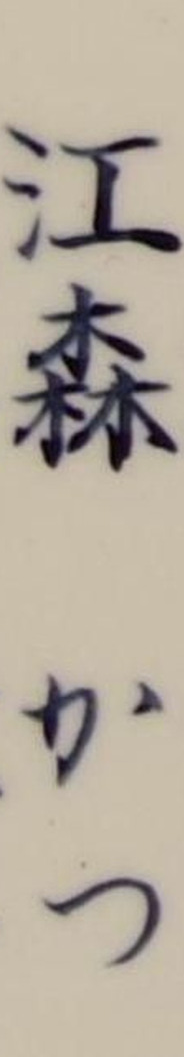江森かつ
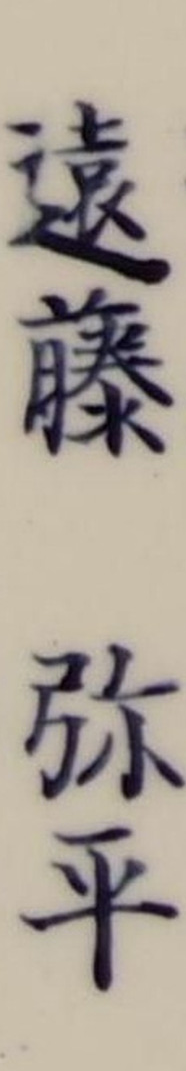遠藤弥平
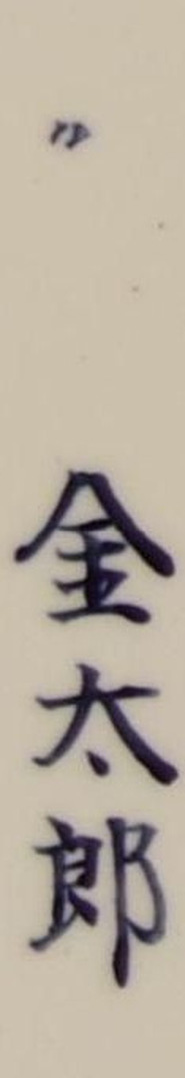金太郎
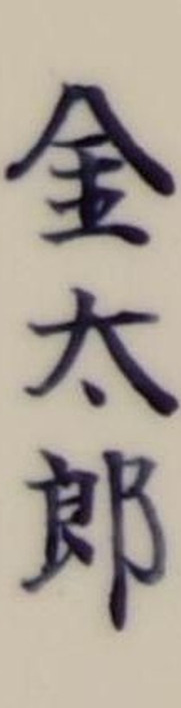金太郎

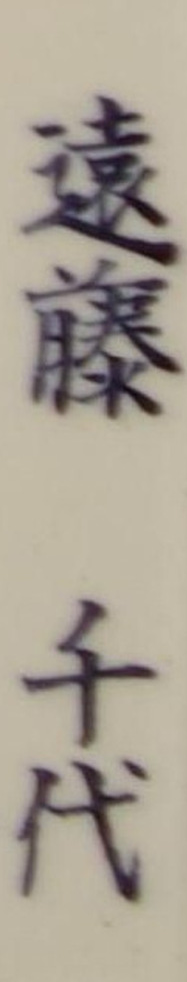遠藤千代
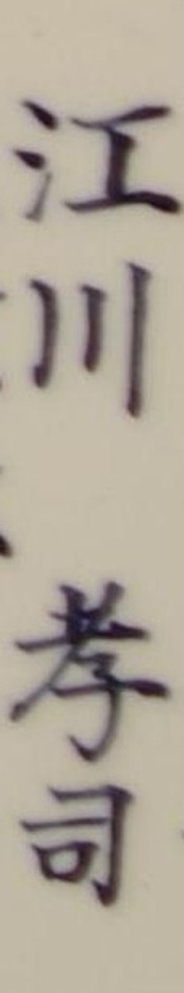江川孝司
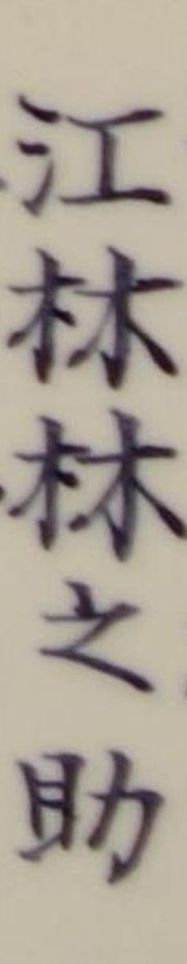江林林之助
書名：E~L
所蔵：高野山金剛峯寺
